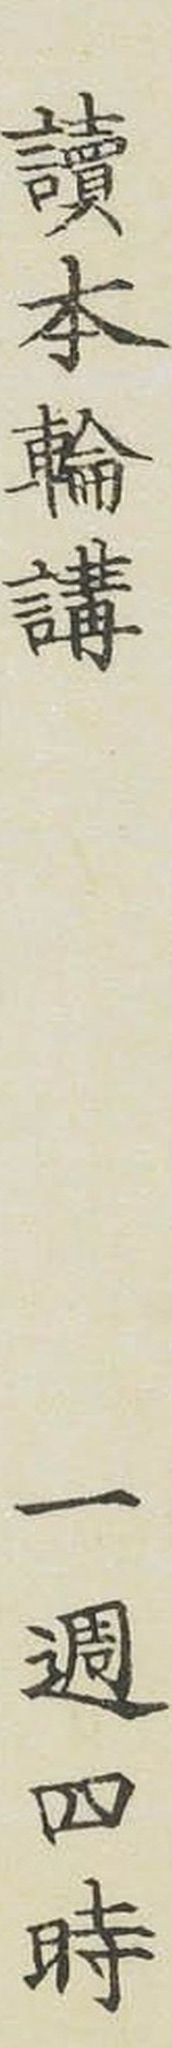読本輪講一週四時
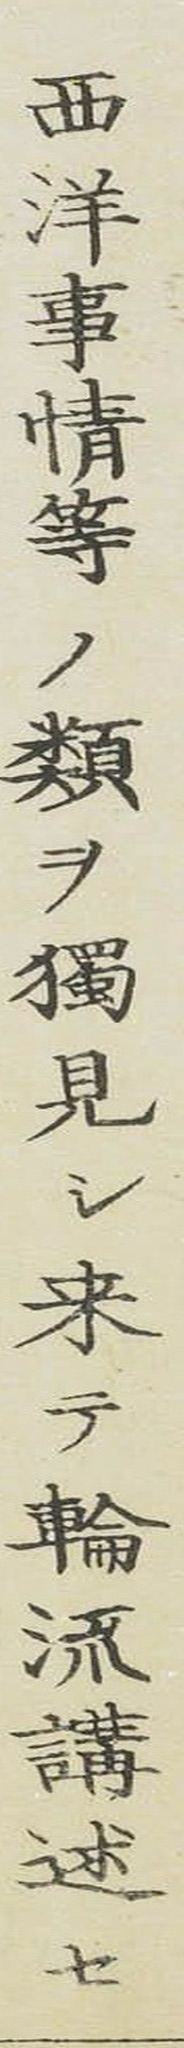西洋事情等ノ類ヲ独見シ来テ輪流講述セ
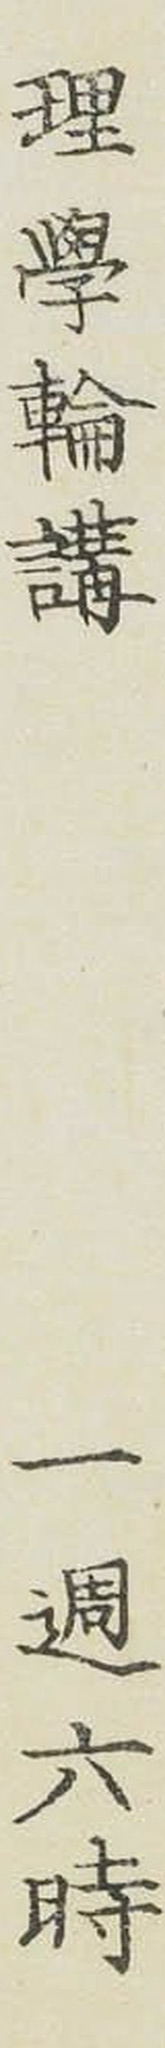理学輪講一週六時
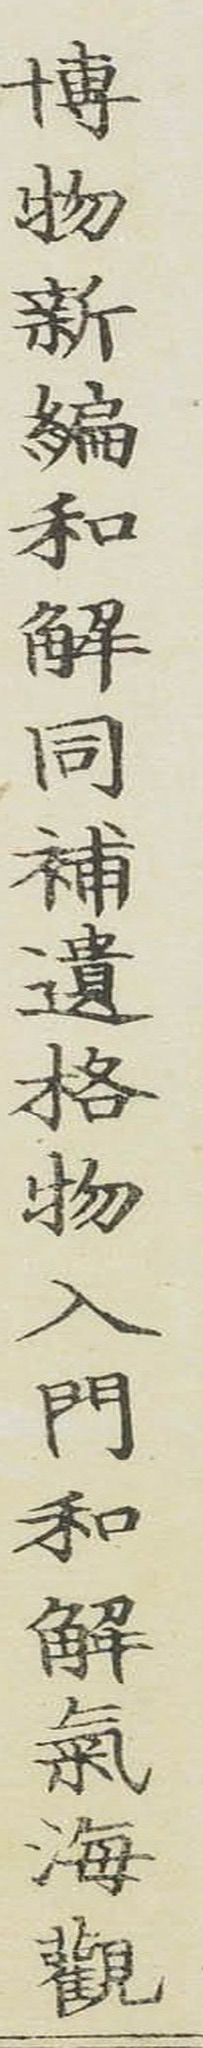博物新編和解同補遺格物入門和解気海観
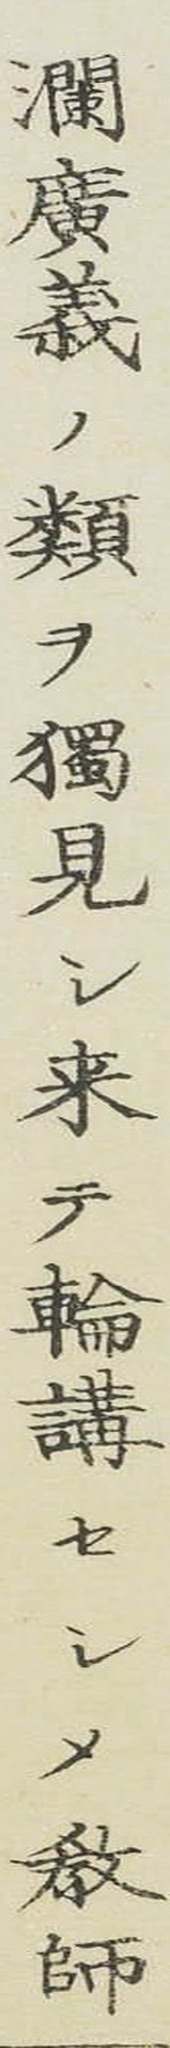瀾広義ノ類ヲ独見シ来テ輪講セシメ教師
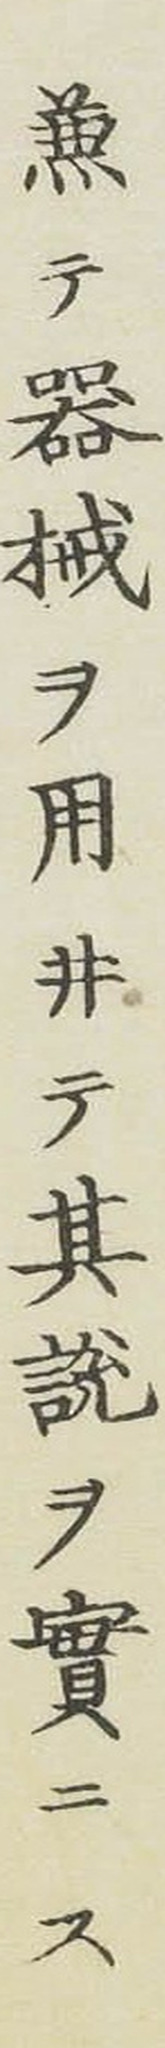兼テ器械用ヰテ其説ヲ実ニス
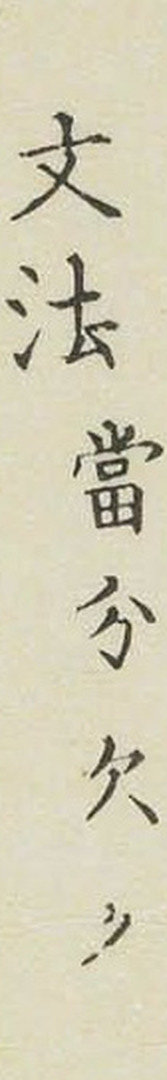文法当分欠ク
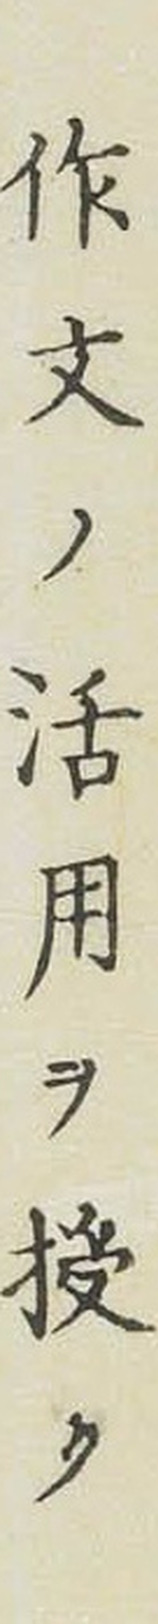作文ノ活用ヲ授ク
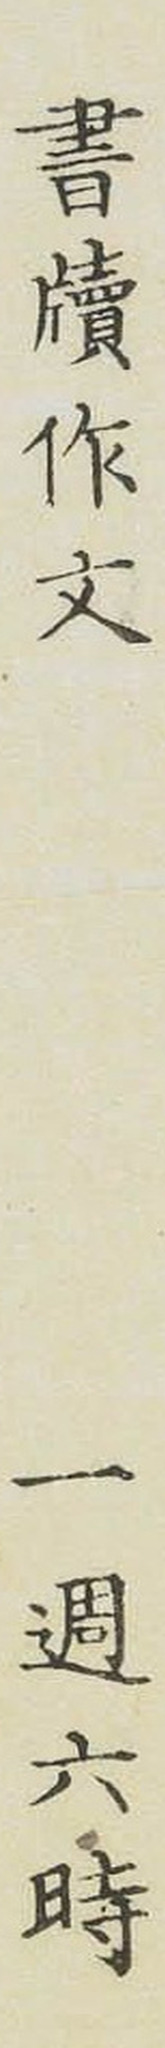書牘作文一週六時
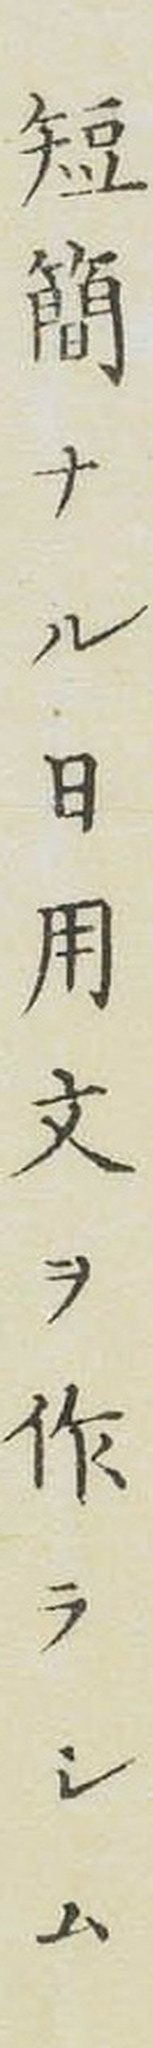短簡ナル日用文ヲ作ラシム
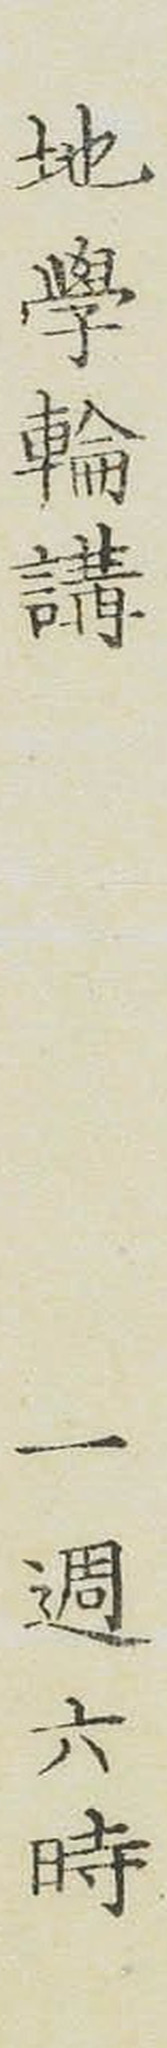地学輪講一週六時
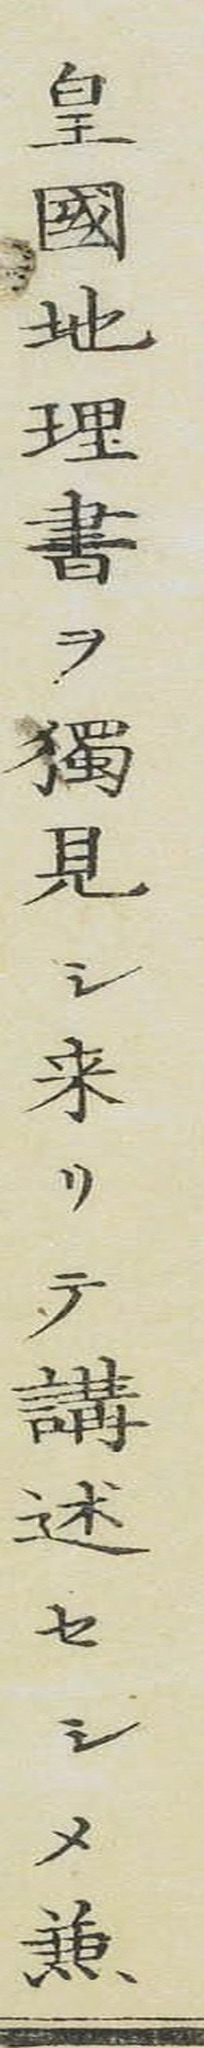皇国地理書ヲ独見シ来リテ講述セシメ兼
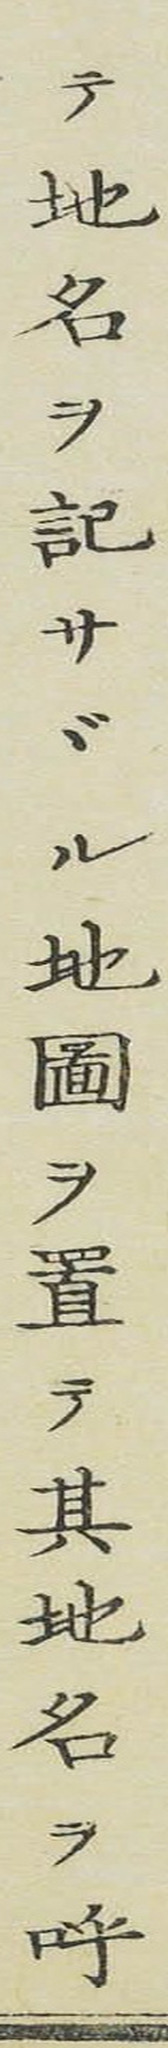テ地名ヲ記サヾル地図ヲ置テ其地名ヲ呼
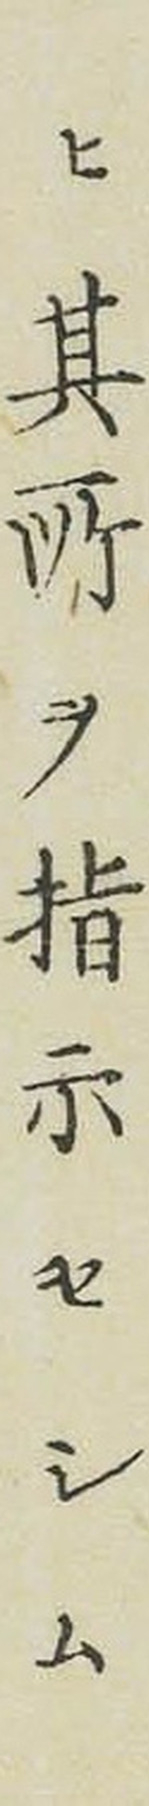ヒ其所ヲ指示セシム
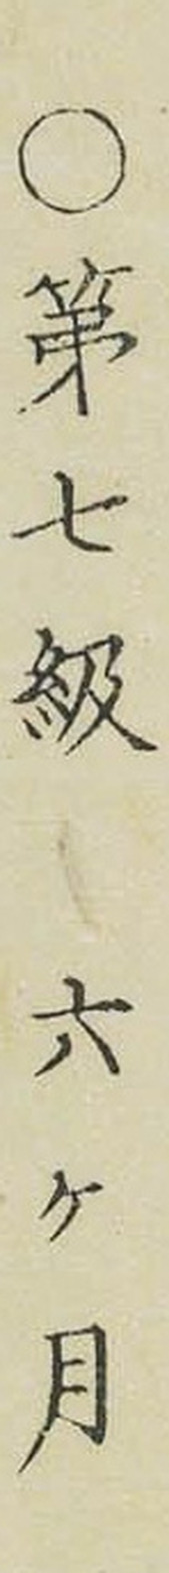○第七級六ケ月

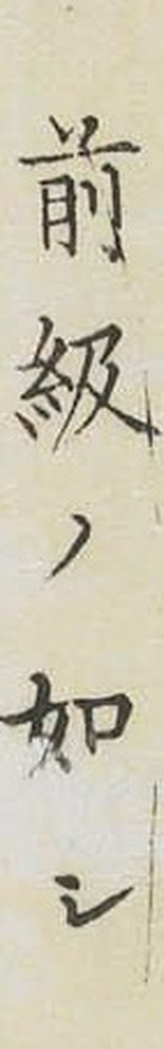前級ノ如シ
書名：小学教則
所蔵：東京学芸大学教育コンテンツアーカイブ
